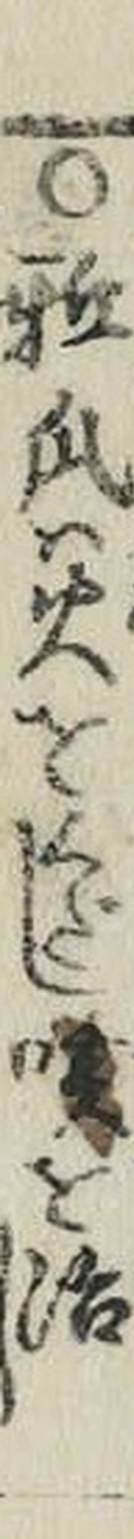○鴉瓜は火をくだし咳を治し
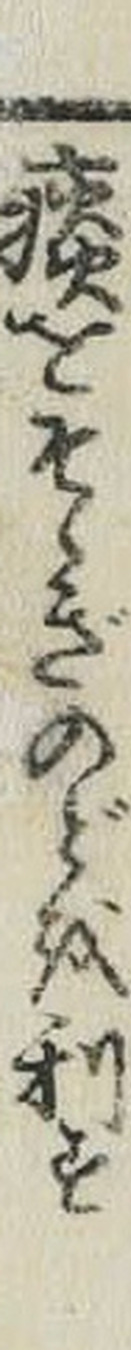痰をそゝぎのどを利す
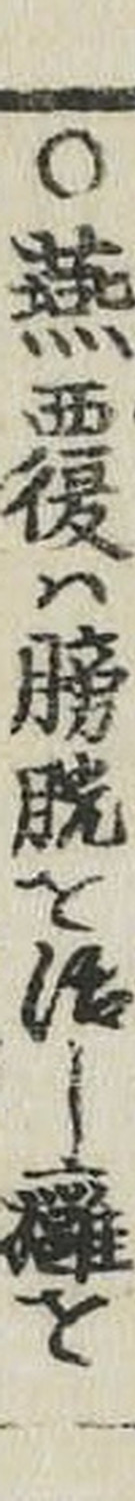○燕覆は膀胱を治し癰を
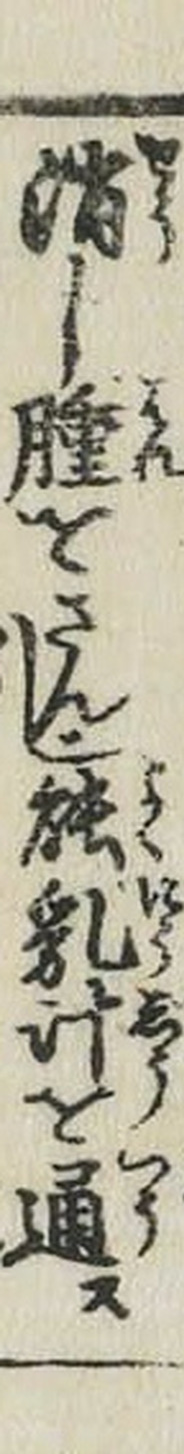消し腫をさんじ能乳汁を通ス
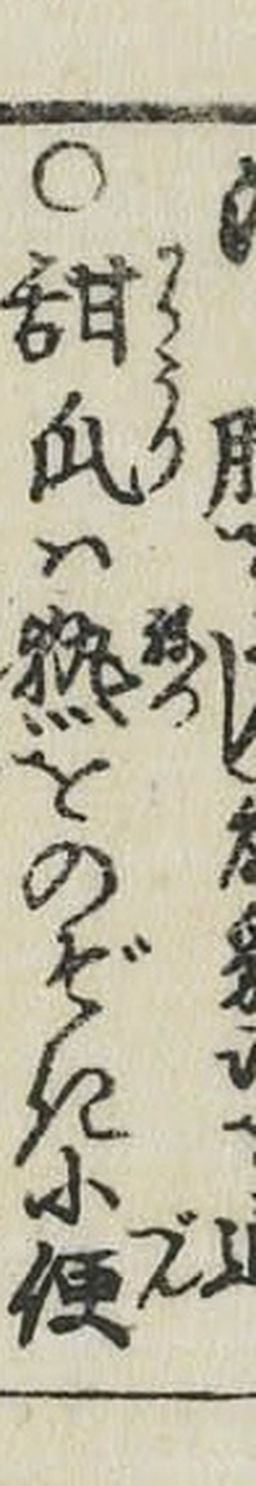○甜瓜は熱をのぞき小便
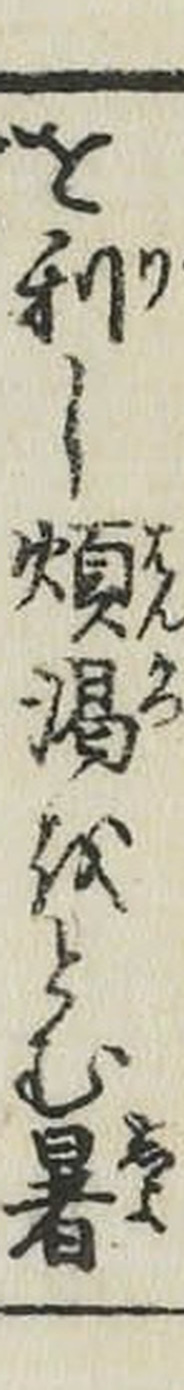を利し煩渇をとむ暑
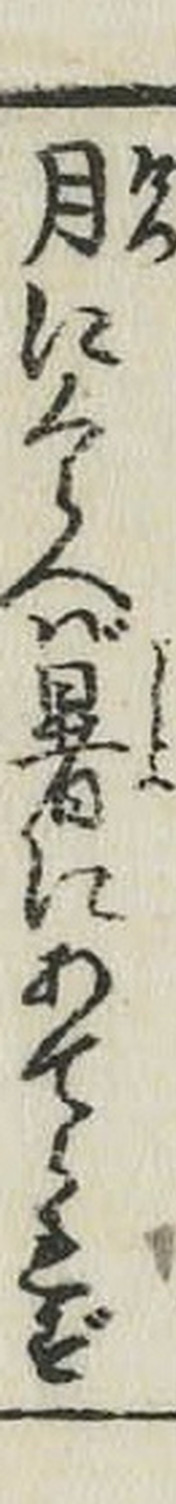月にくらへば暑にあてられず
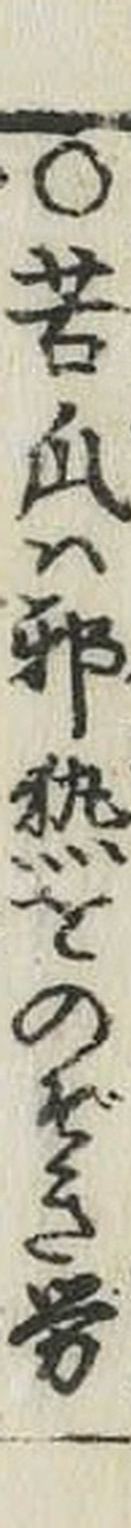○苦瓜は邪熱をのぞき労
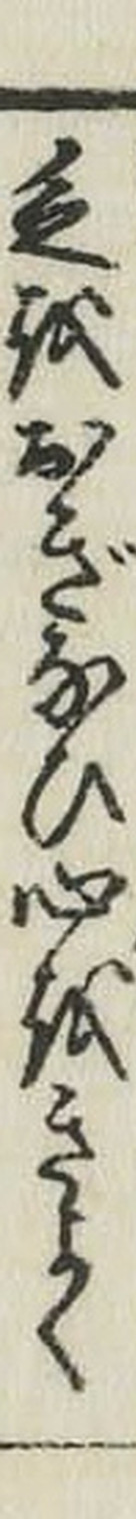乏をおぎなひ心をきよく
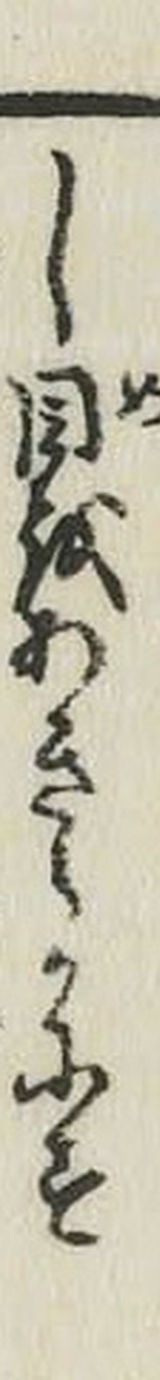し目をあきらかにす
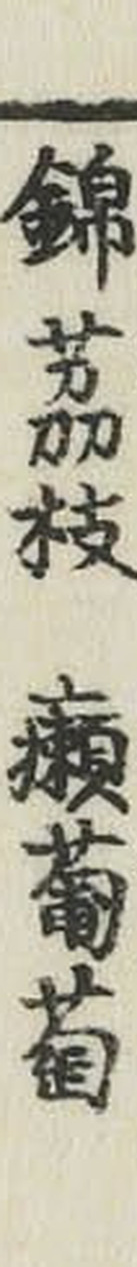錦茘支癩葡萄
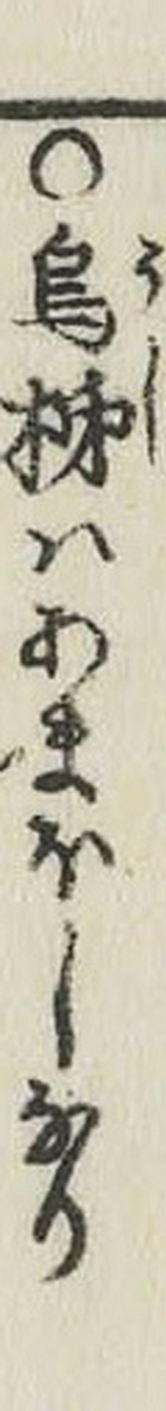○烏柿はあまほしなり
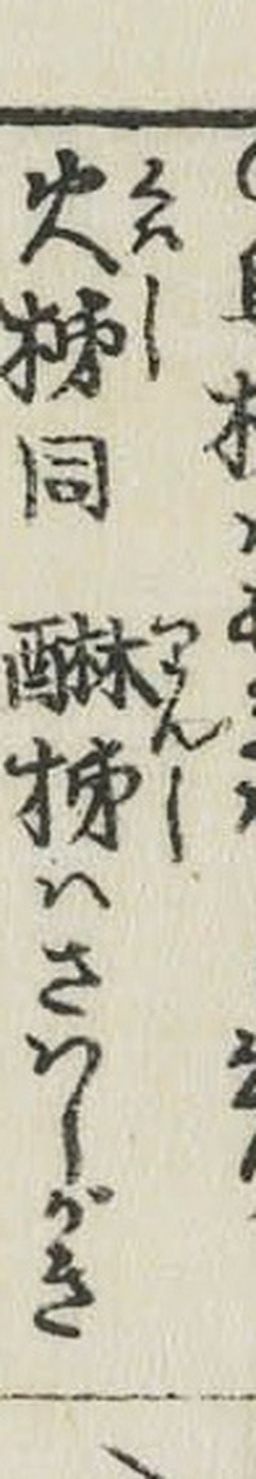火柿同醂柿はさはしがき
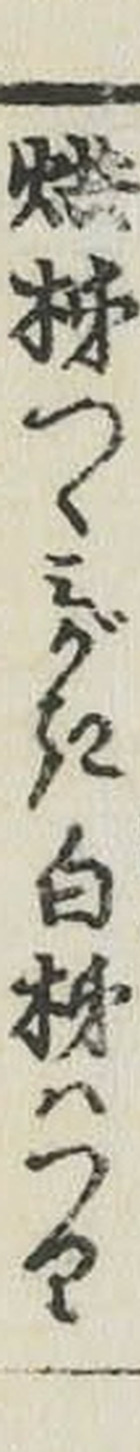烘柿つつみがき白柿はつり
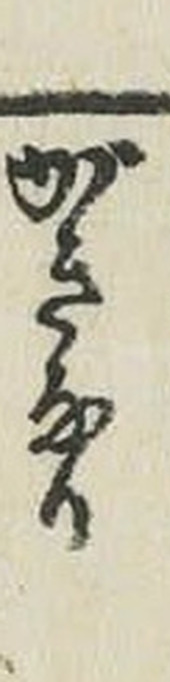がきなり
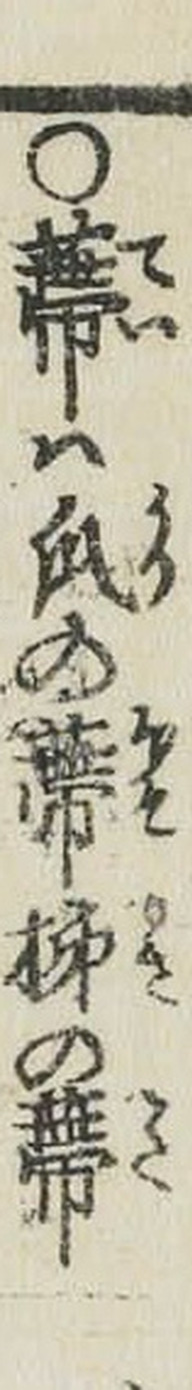○蔕は瓜の蔕柿の蔕
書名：増補頭書訓蒙図彙大成 10巻 8:巻之17-19
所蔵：東京学芸大学教育コンテンツアーカイブ
